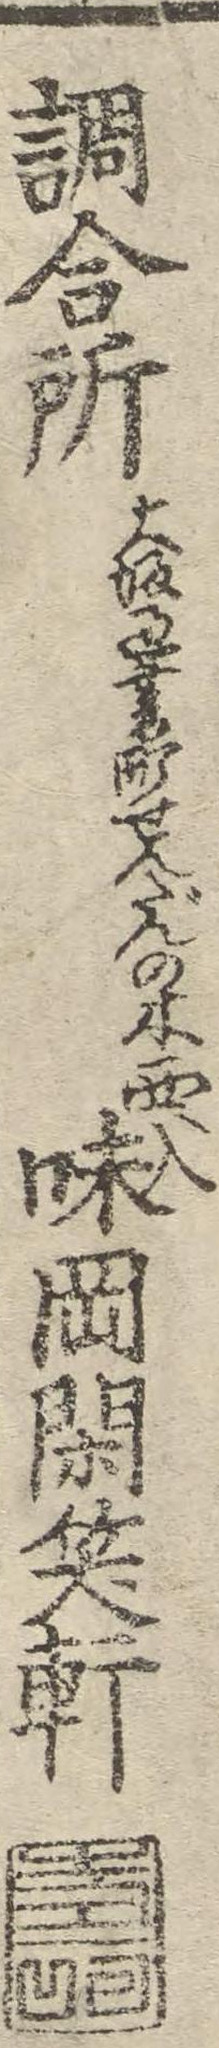調合所大坂過書町せんだんの木西へ入味岡閑笑軒
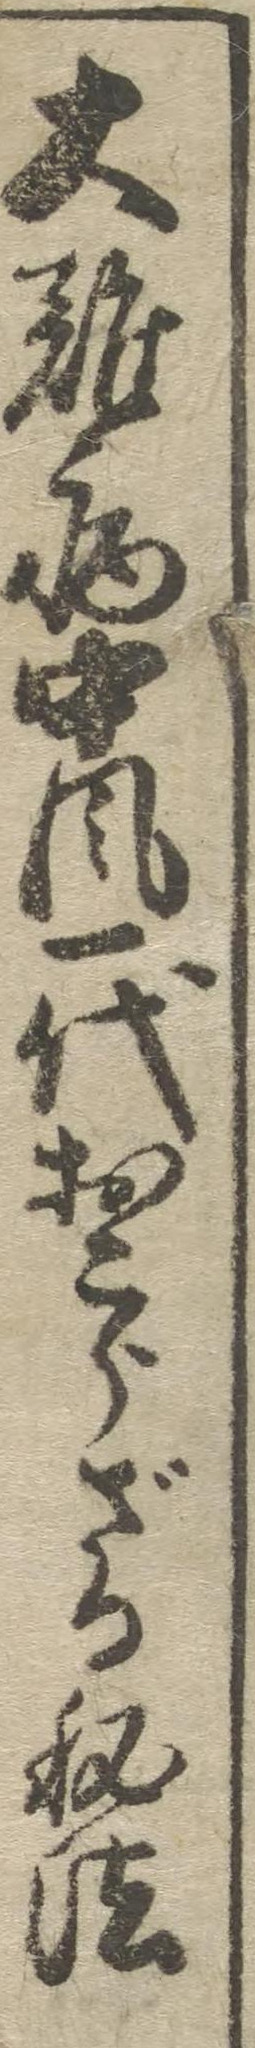大難病中風一代おこらざる秘法
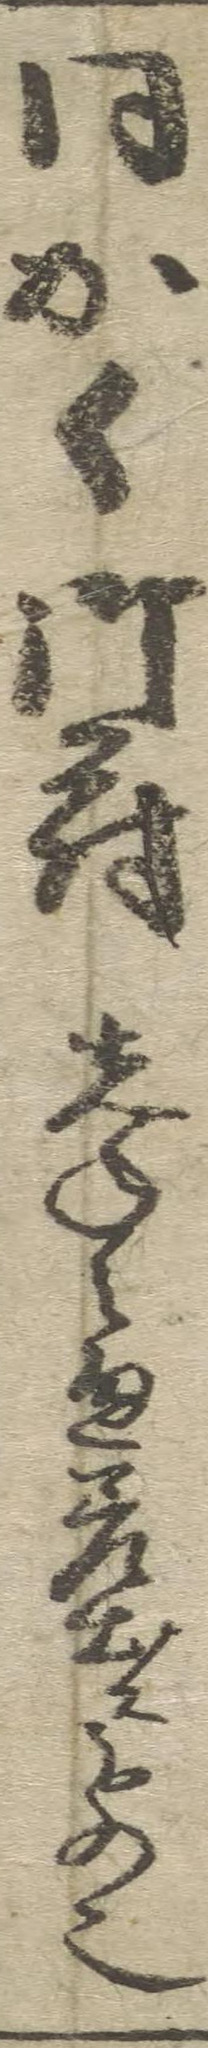同かく御符先年の通差出すもの也
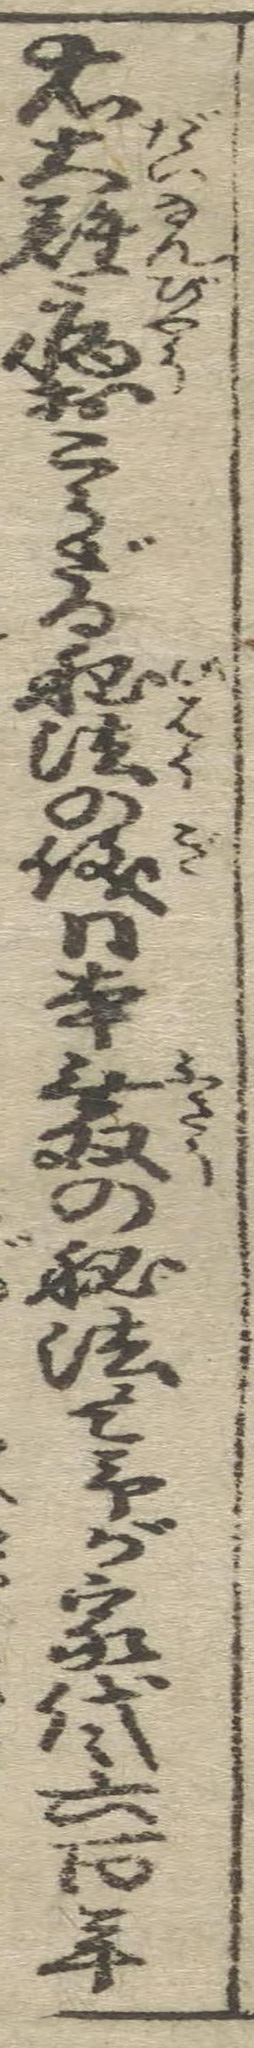右大難病おこらざる秘法の儀日本無双の秘法にて予が家代々六百年
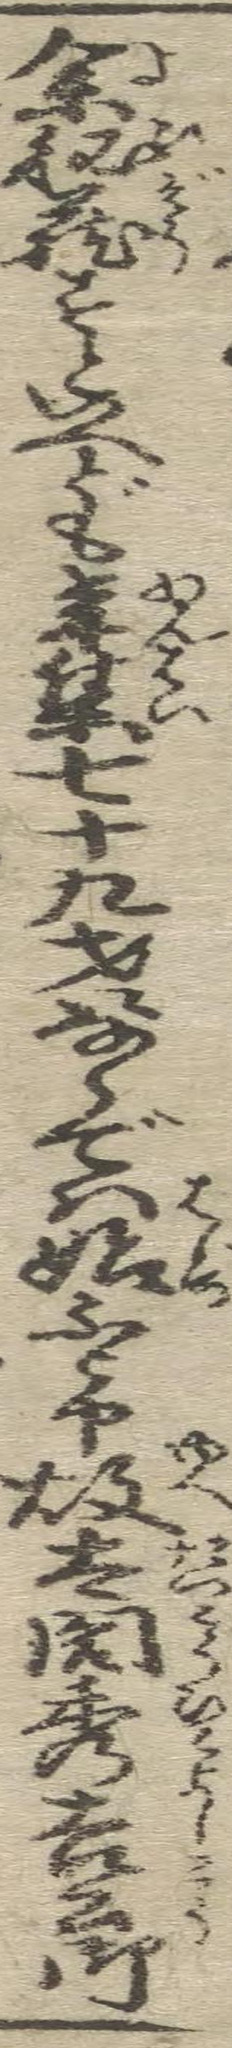余秘蔵すといへども年輩七十九才にならでは始不被申故太閤秀吉公御
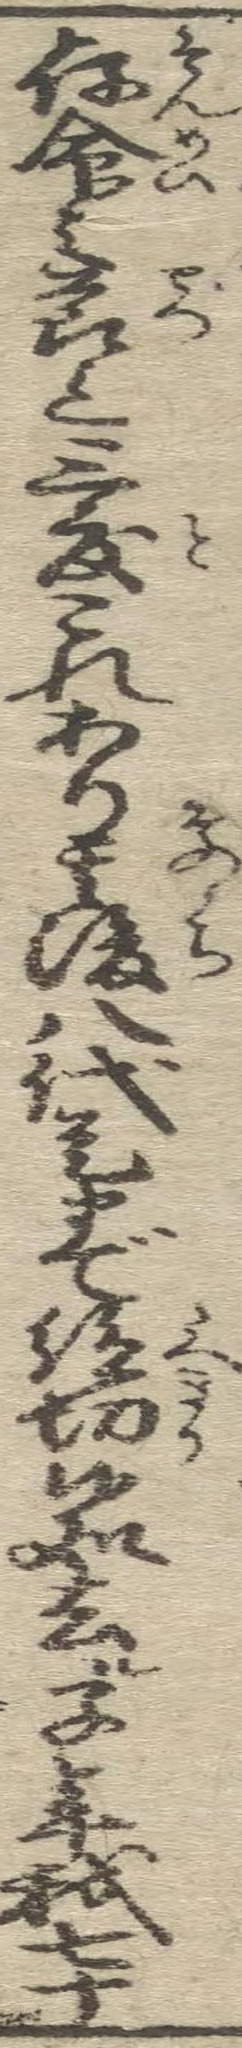存命の節迄三度これあり其後八代是まで絶切候処去る子年我七十
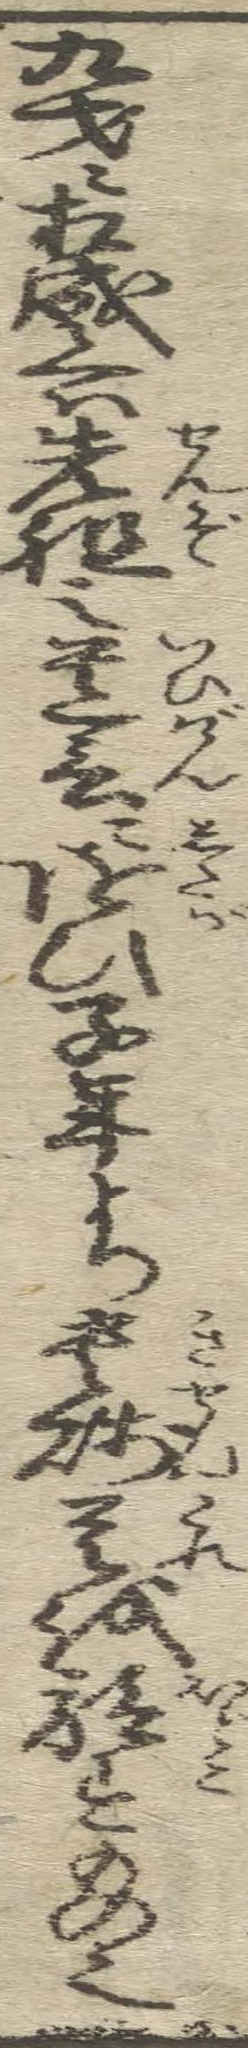九才に相成候へは先祖の遺言に従ひ子年より貴賎是を施すもの也
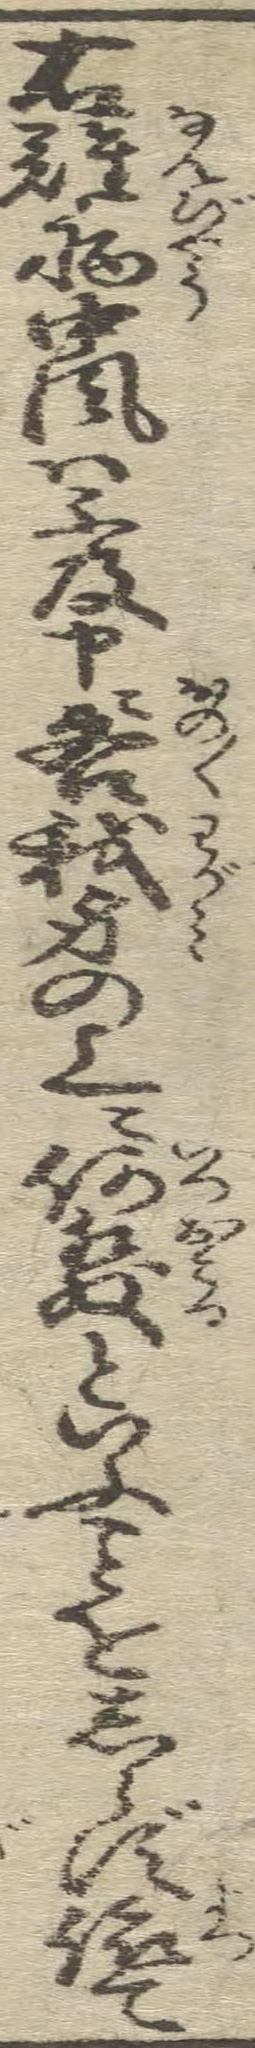右難病中風は不及申に各我身の上に何発といふことをしらず依て
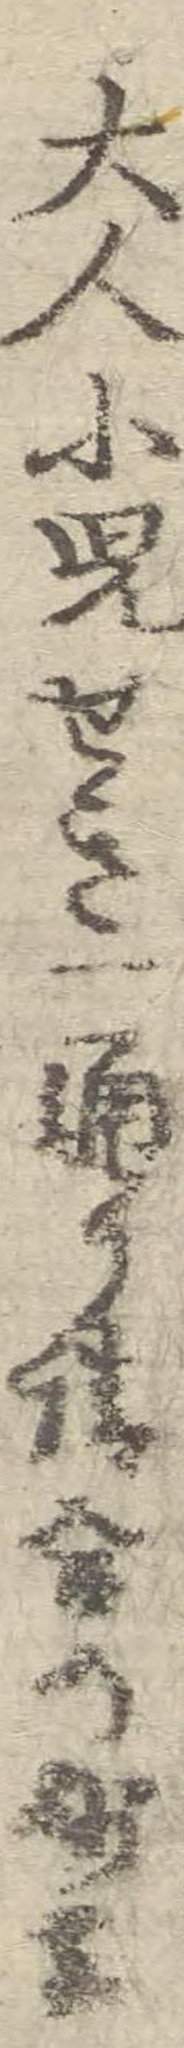大人小児せき一通り請合の妙薬
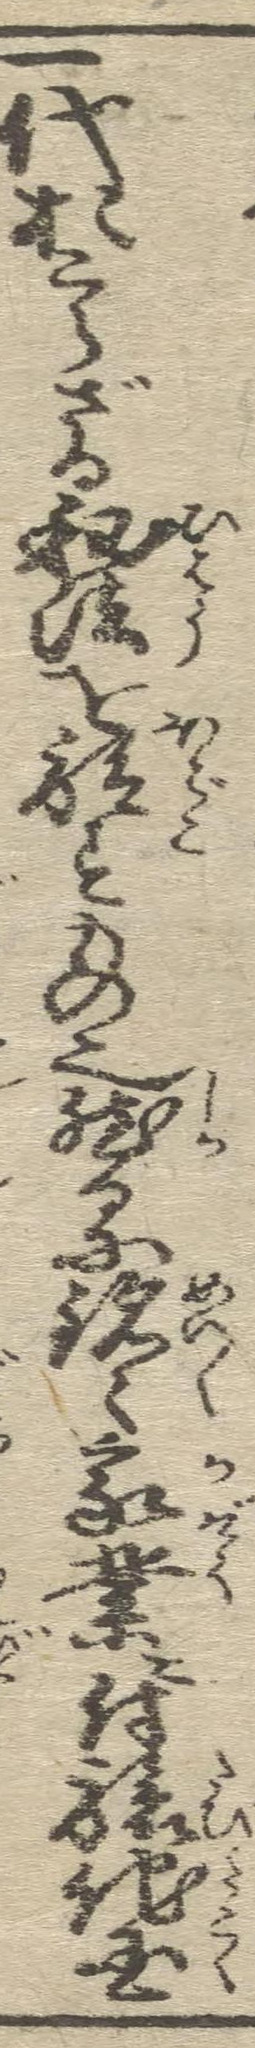一代おこらざる秘法を施すもの也然るに銘々家業に付旅他国
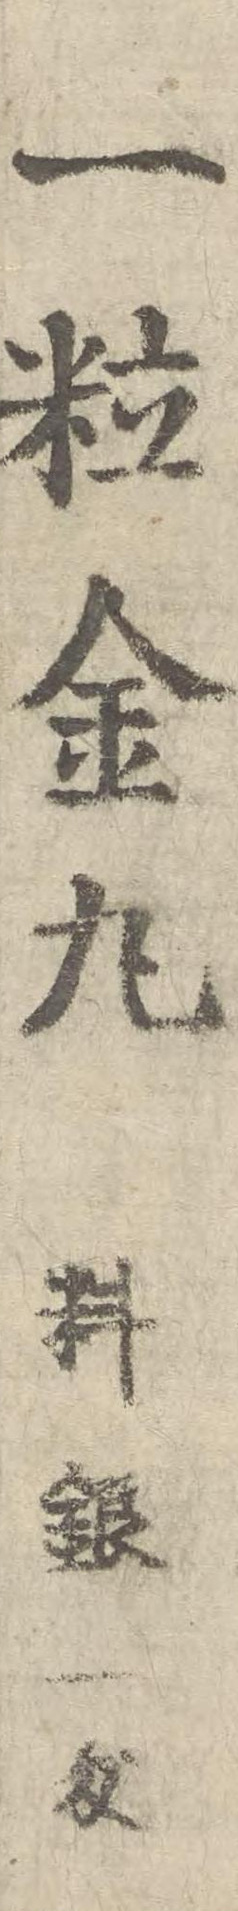一粒金丸料銀一匁
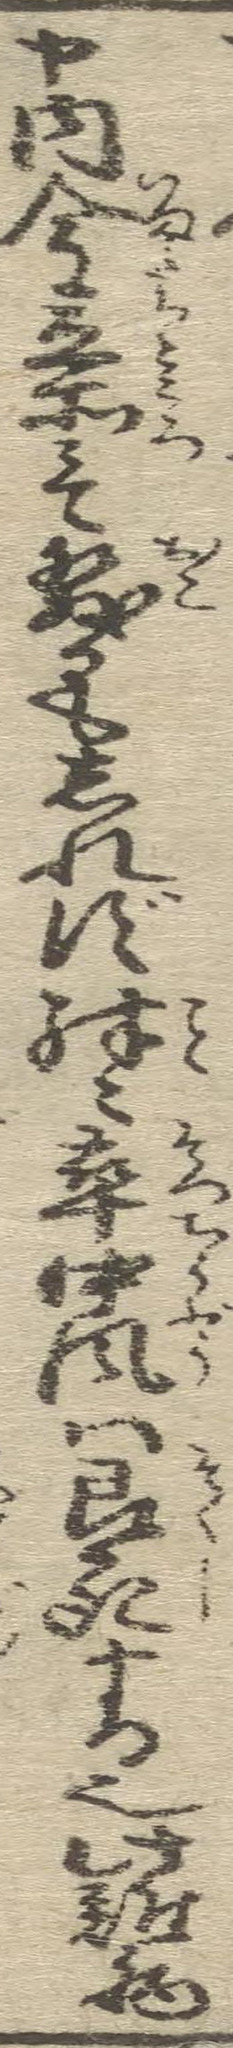申内今立所にて発るもしれず殊に卒中風は即死する也此難病
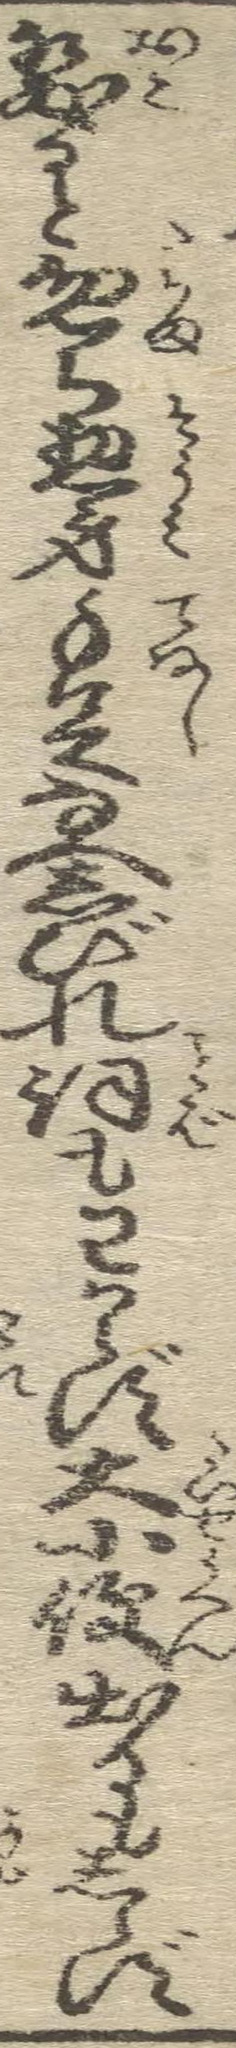発ると忽ち惣身手足なへしびれ詞もわからず大小便出るもしらず
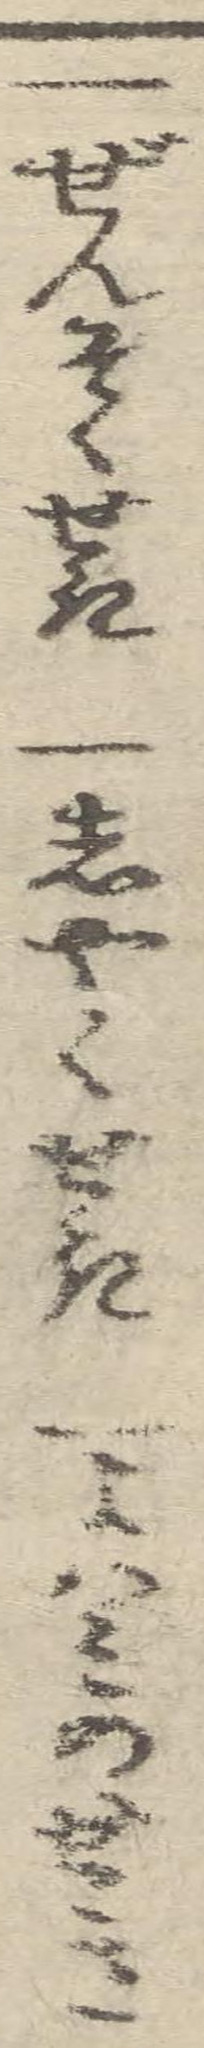一ぜんそくせき一しやくせき一よはみのせき
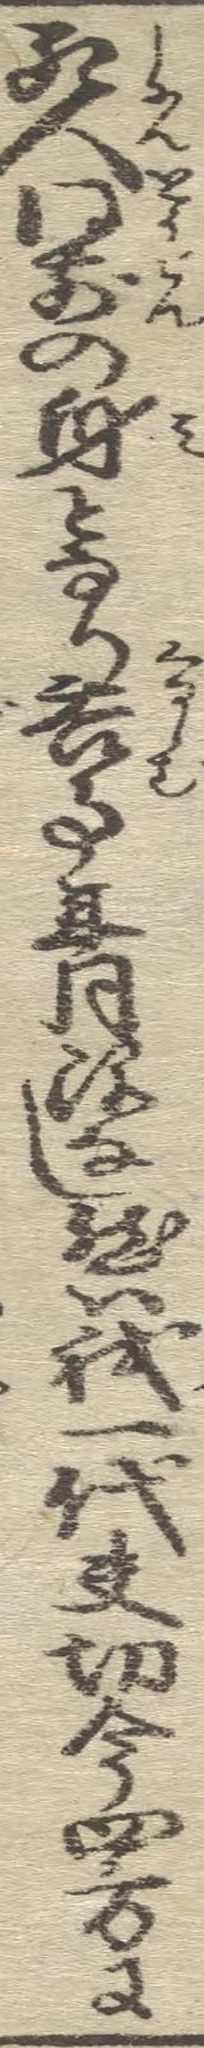死人同前の身となり苦事年月限なし然は我一代夫切今四方に
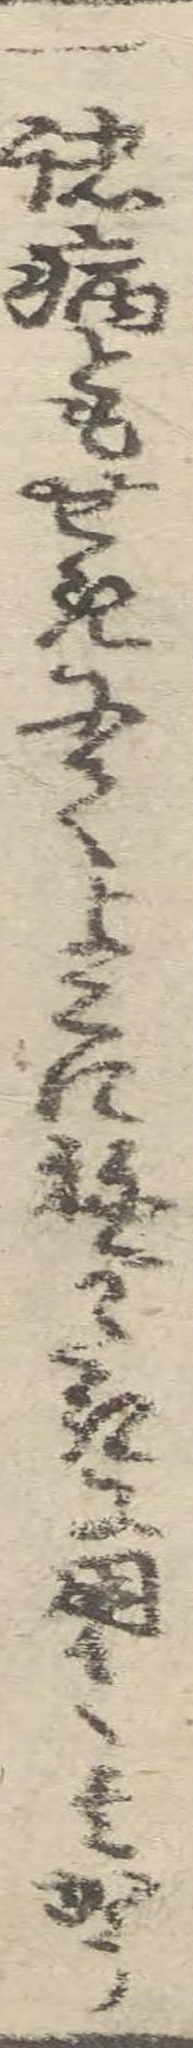一諸病ともせきにてよこにねがたきに用て其かう
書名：浪華薬種問屋能書張交帖. 二
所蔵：国立国会図書館 National Diet Library, JAPAN
